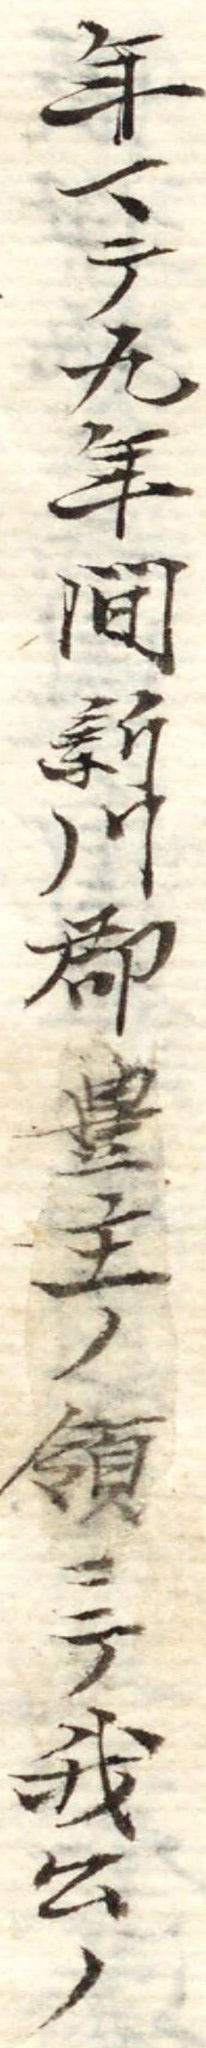年まて九年間新川郡豊主の領にて我公の
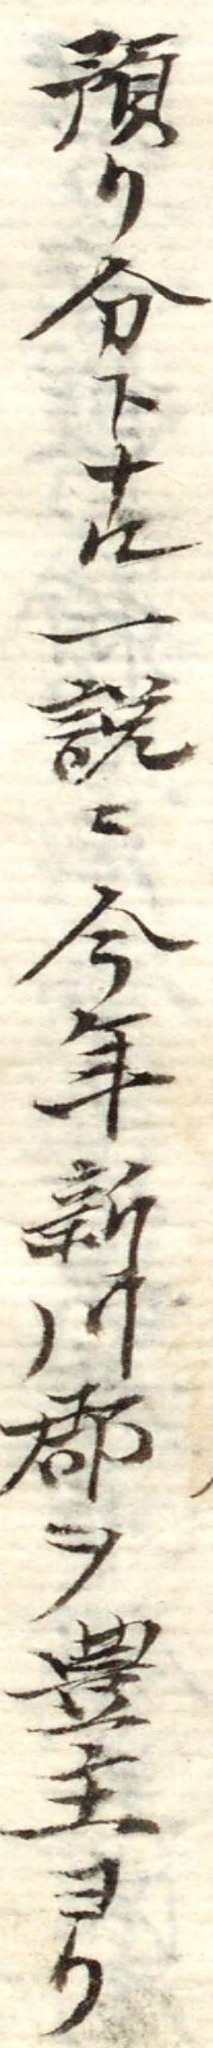預り分となる一説に今年新川郡を豊主より
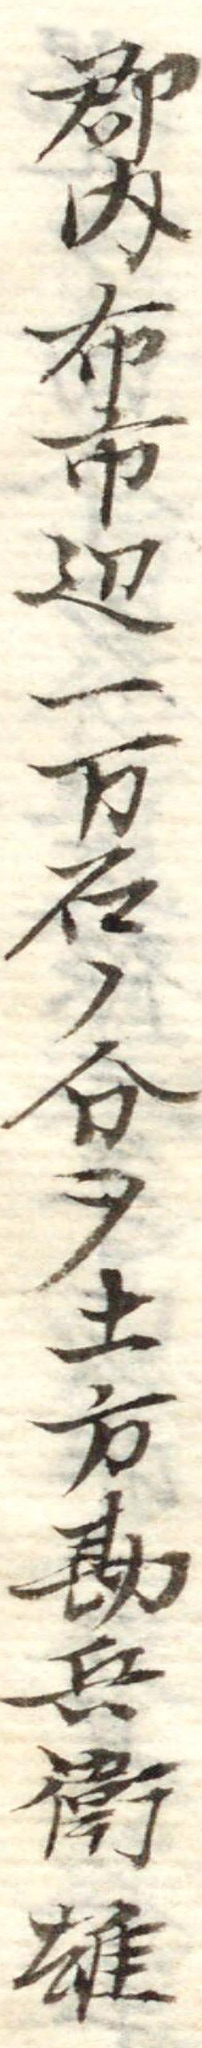郡内布市辺一万石の分を土方勘兵衛雄
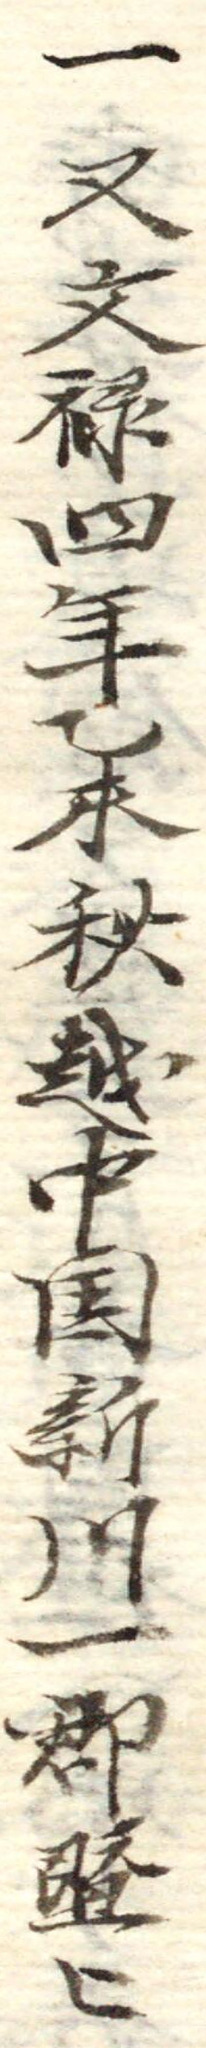一又文禄四年乙未秋越中国新川一軍曁ひ

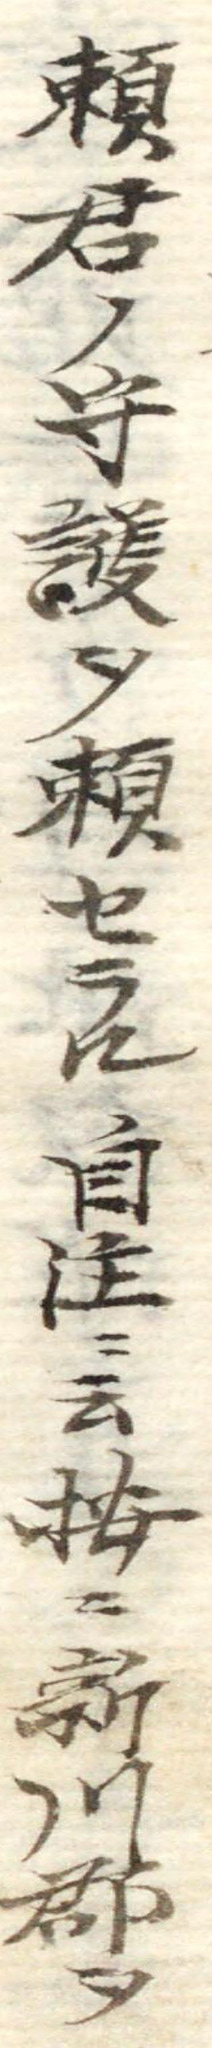頼君の守護を頼せらる自注に云按に新川郡を
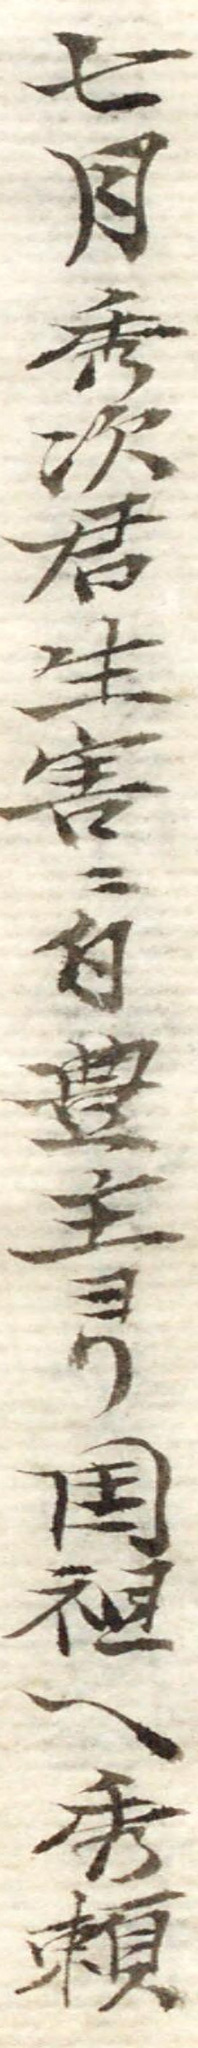七月秀次君生害に付豊主より国祖へ秀頼
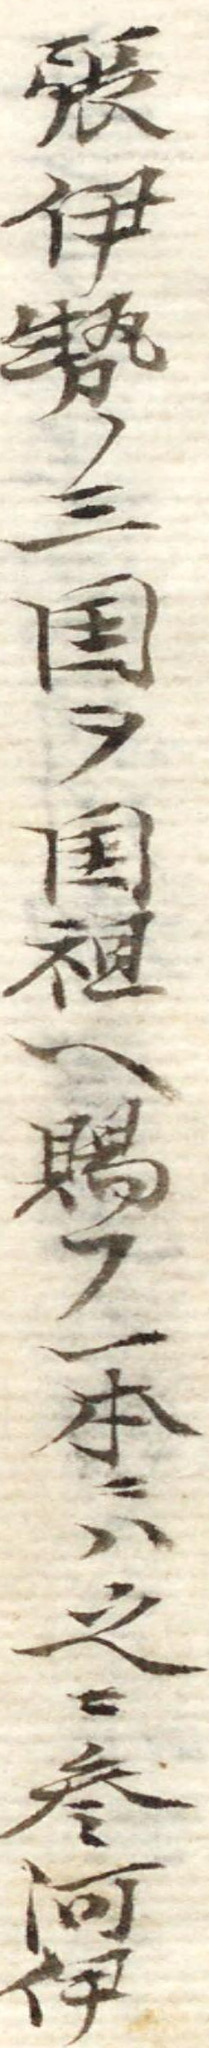張伊勢の三国を国祖へ賜ふ一本には之に参河伊
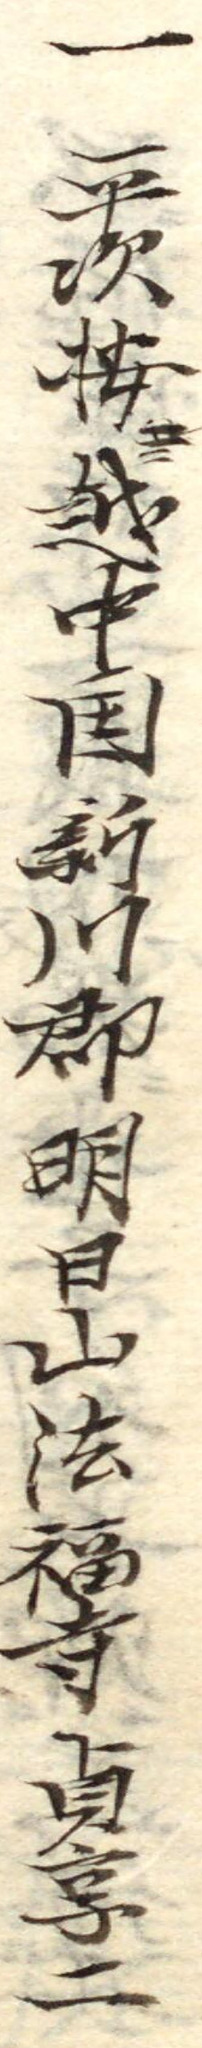一平次按に越中国新川郡明日山法福寺貞享二
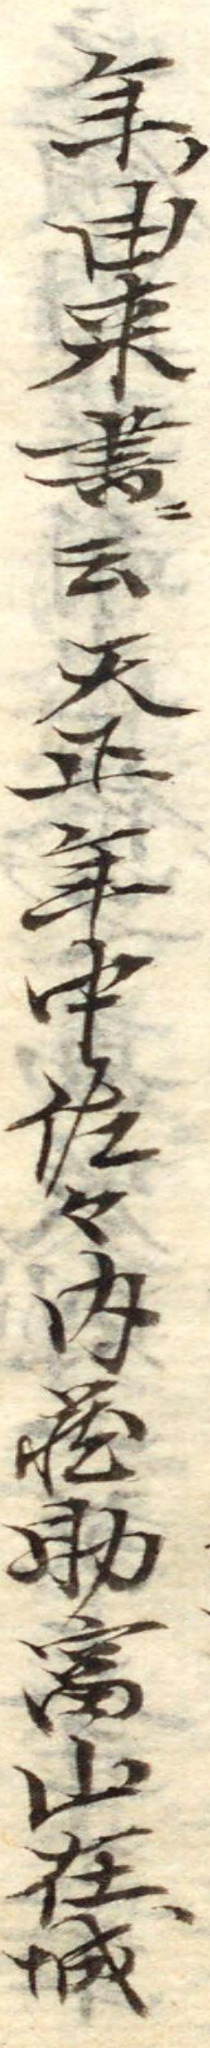年の由来書に云天正年中佐々内蔵助富山在城
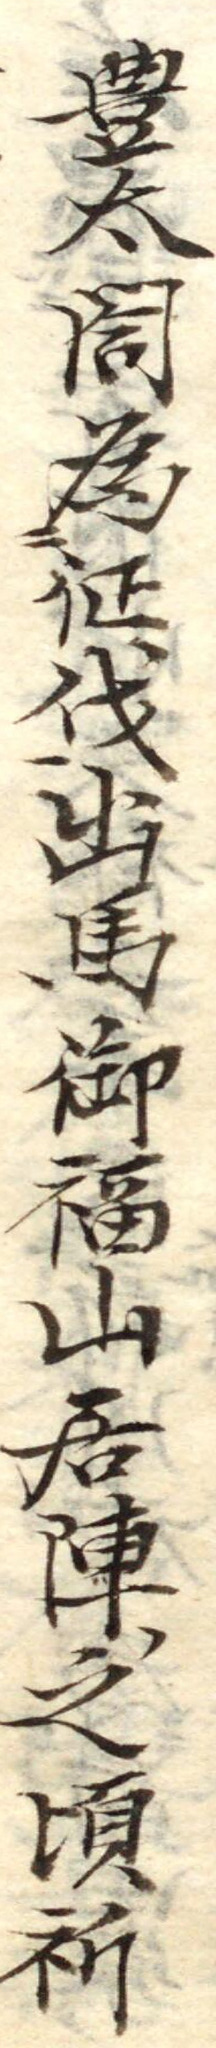豊太閤為征伐出馬御福山居陣之頃祈
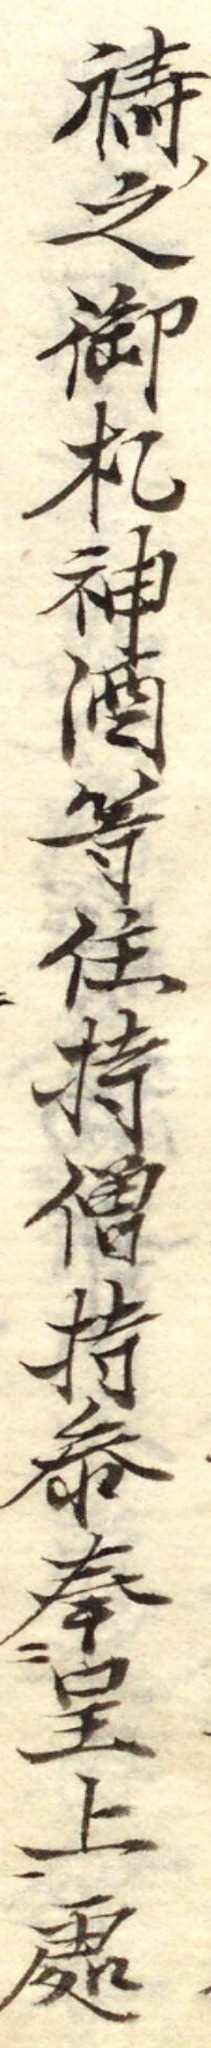祷之御札神酒等住持僧持参奉呈上處
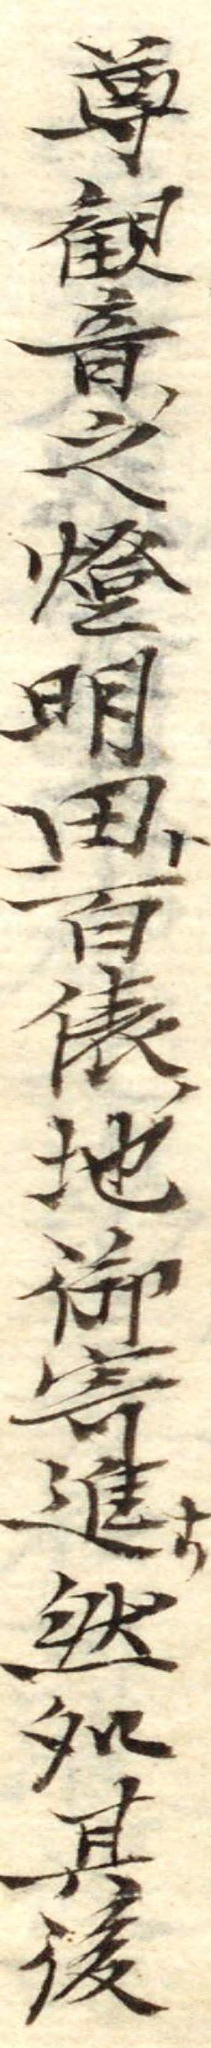尊観音之燈明田と百俵の地御寄進なり然処其後
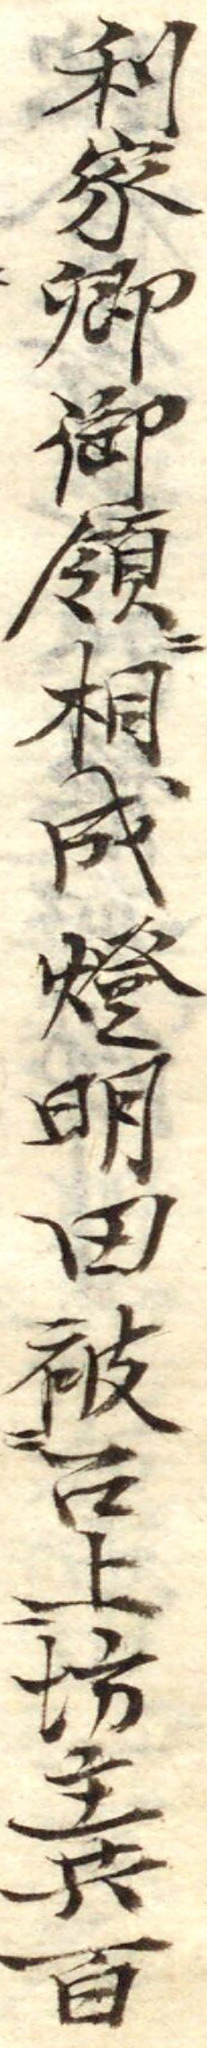利家卿御両に相成燈明田被召上坊主共百
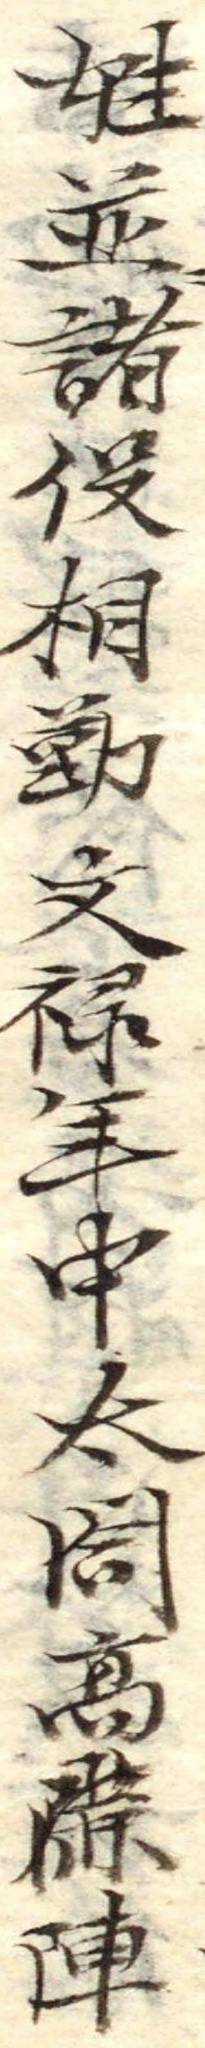姓並に諸役相勤文禄年中太閤高麗陣
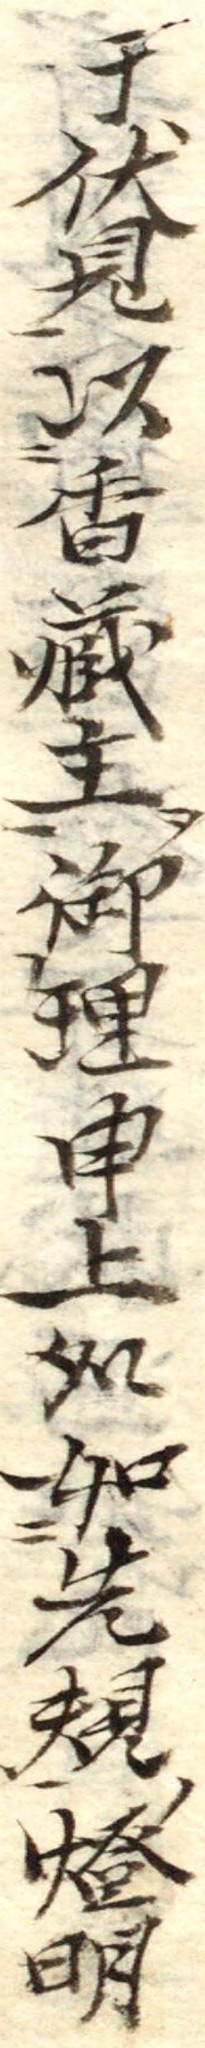干伏見以香蔵主を御理申上処如先䂓の燈明

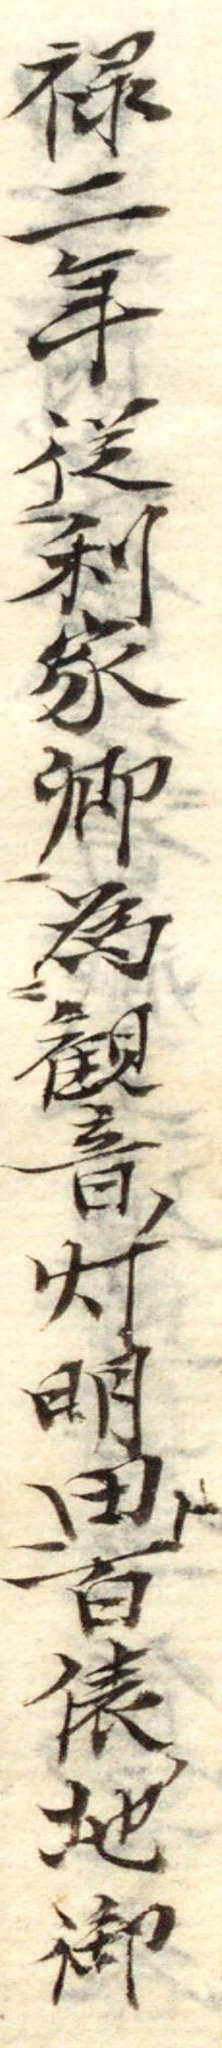禄二年従利家卿為観音の灯明田と百俵地御
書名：前田家封国証書集録
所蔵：Ishikawa Prefectural Library
